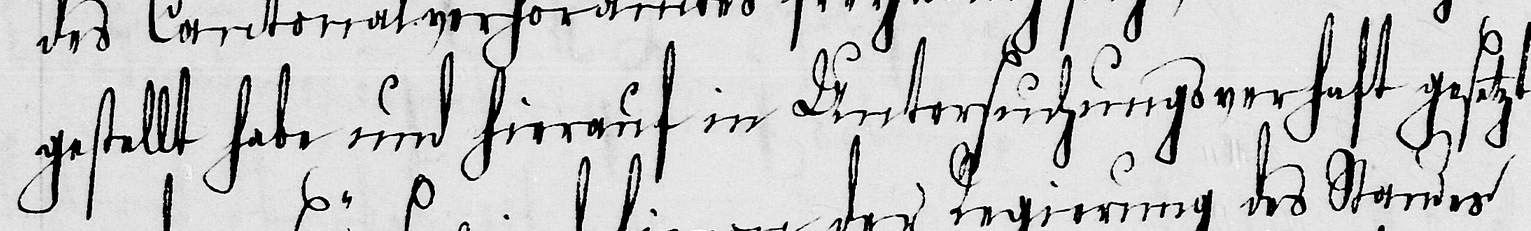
gestellt habe und hierauf in Untersuchungsverhaft ges¬
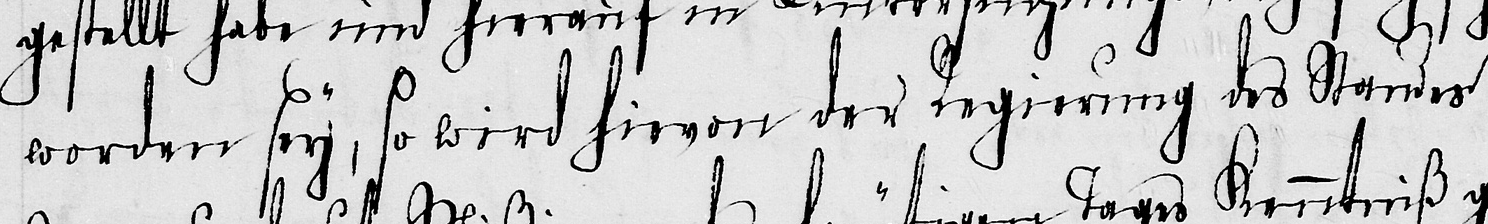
worden sey, so wird hievon der Regierung des Standes
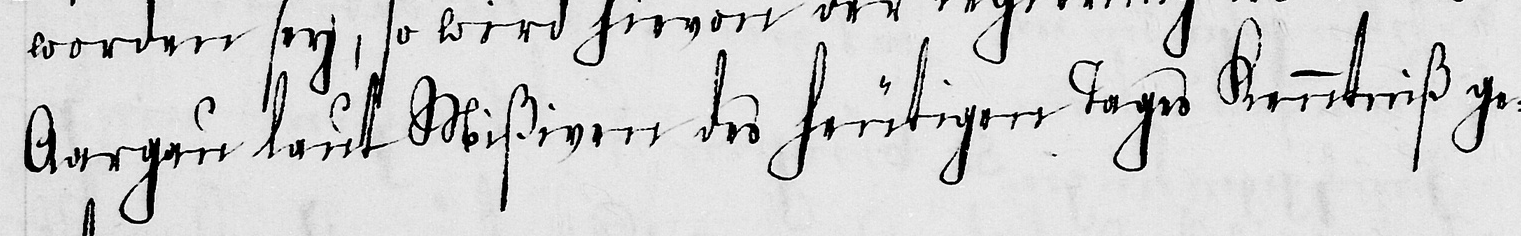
Aargau laut Mißiven des heutigen Tages Kenntniß ge¬
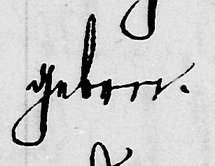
geben.
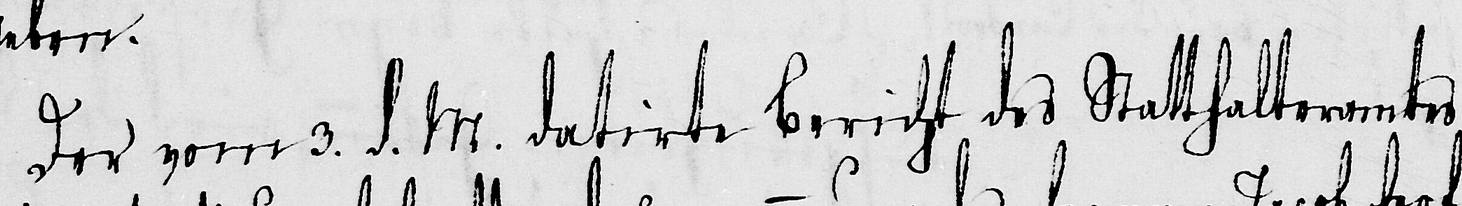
Der vom 3. d. M. datirte Bericht des Statthalteramtes
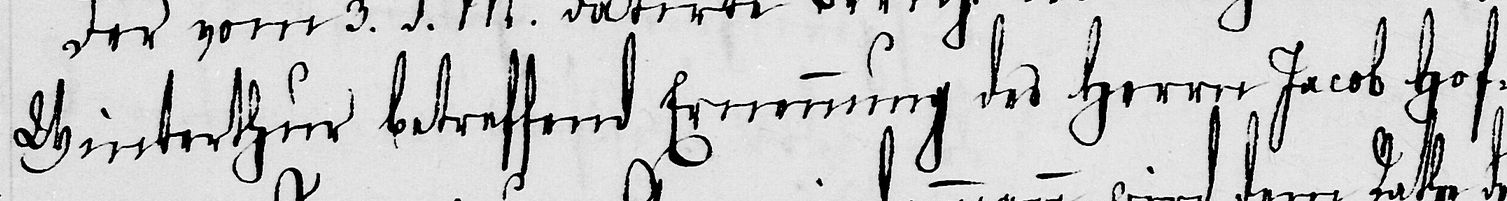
Winterthur betreffend Ernennung des Herrn Jacob Hof¬
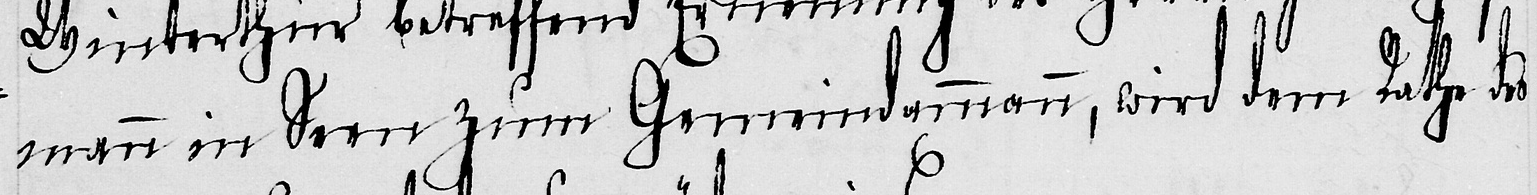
mann in Seen zum Gemeindammann, wird dem Rathe des
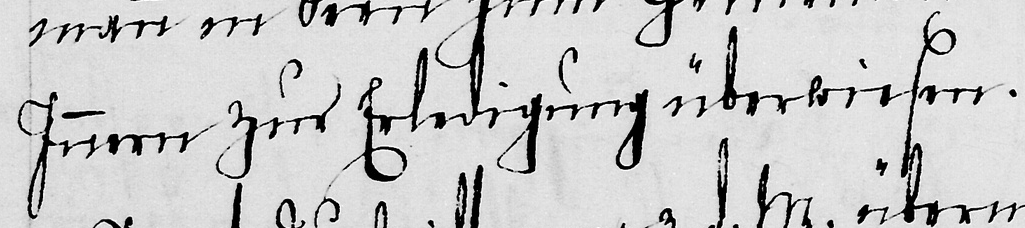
Innern zur Erledigung überwiesen.
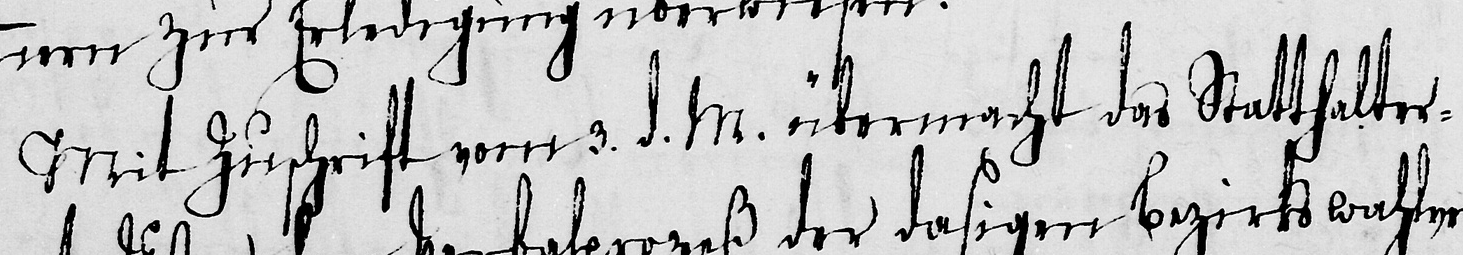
Mit Zuschrift vom 3. d. M. übermacht das Statthalter¬
